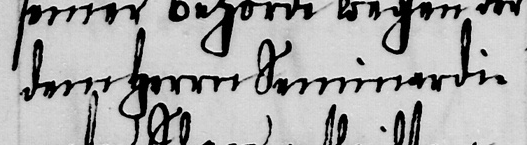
dem Herrn Seminardi¬
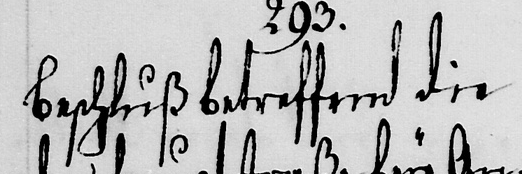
betreffend die
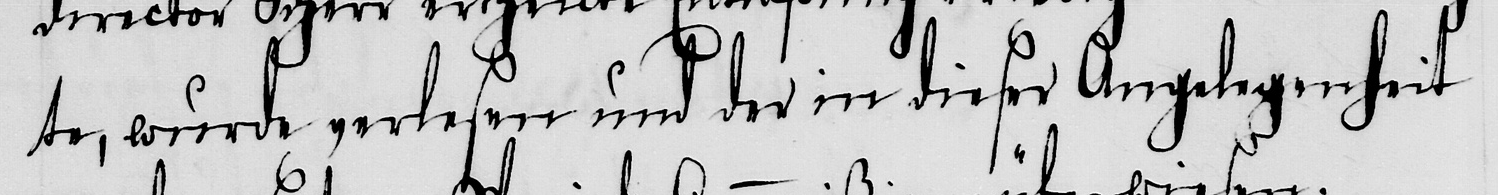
te, wurde verlesen und der in dieser Angelegenheit
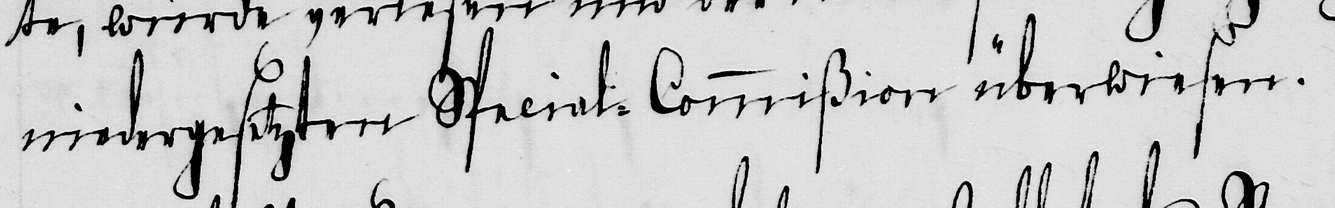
niedergesetzten Special-Commißion überwiesen.
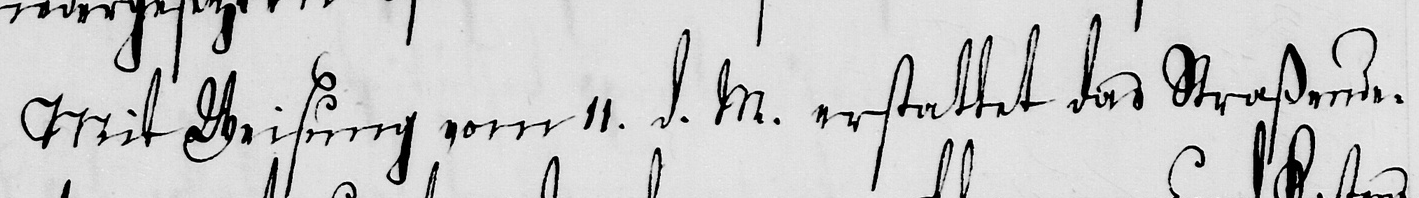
Mit Weisung vom 11. d. M. erstattet das Straßende¬
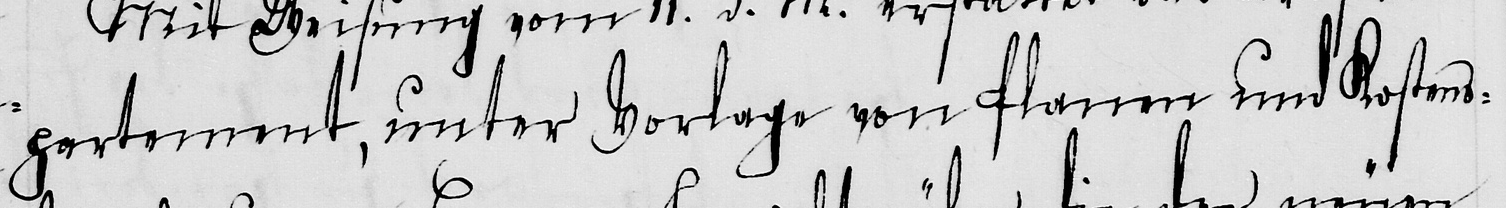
partement, unter Vorlage von Planen und Kostens¬
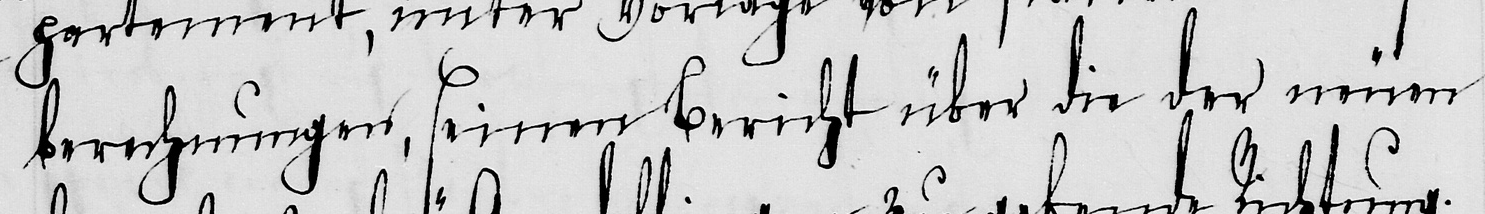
berechnungen, seinen Bericht über die der neuen
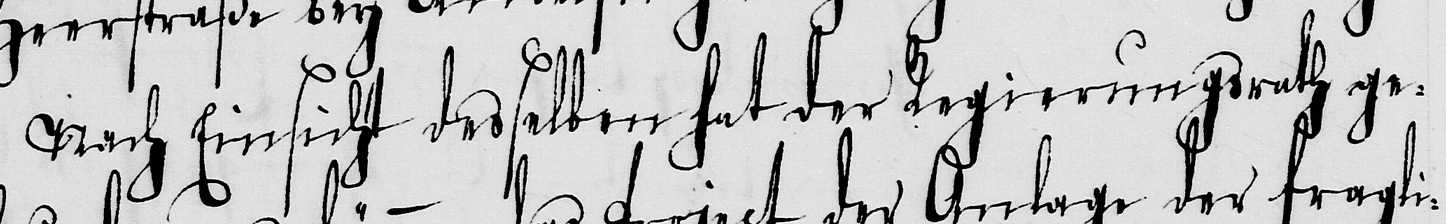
Nach Einsicht desselben hat der Regierungsrath ge¬
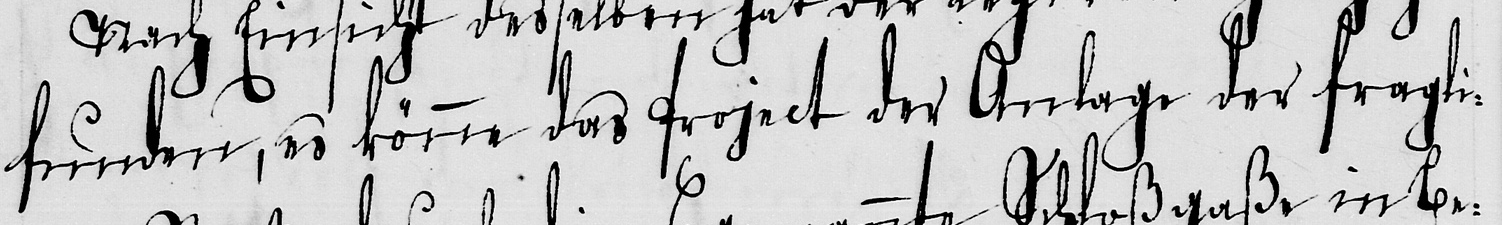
funden, es könne das Project der Anlage der fragli¬
